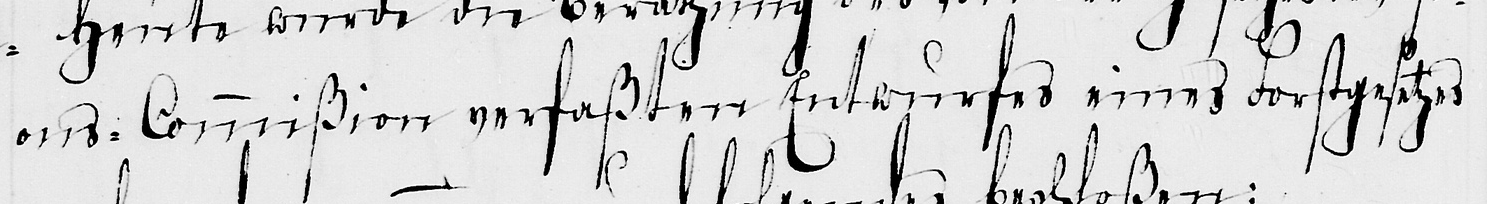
ions-Commißion verfaßten Entwurfes eines Forstgesetzes
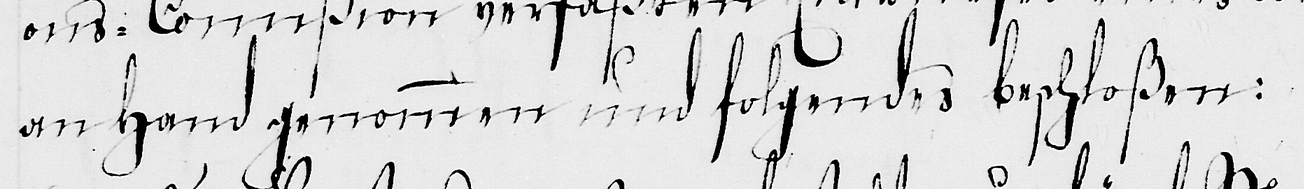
an Hand genommen und folgendes beschloßen:
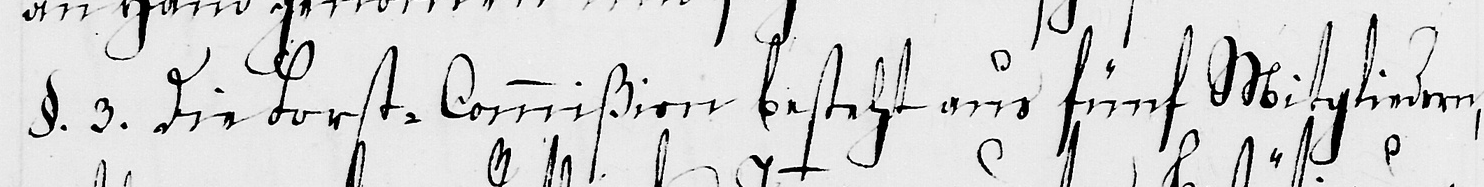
§. 3. Die Forst-Commißion besteht aus fünf Mitgliede¬
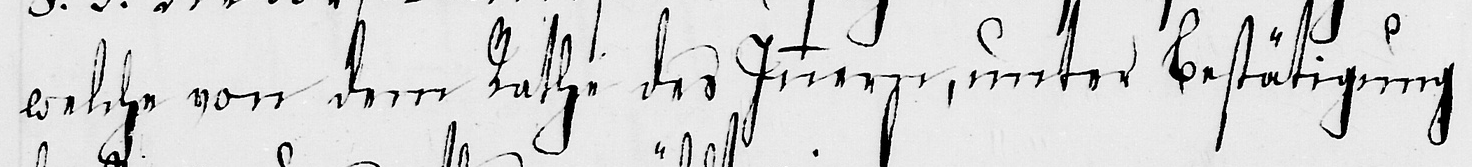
welche von dem Rathe des Innern, unter Bestätigung
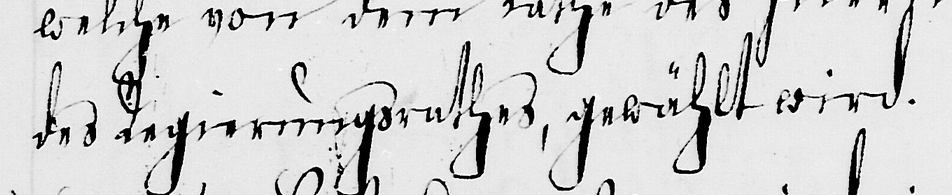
des Regierungsrathes, gewählt wird.
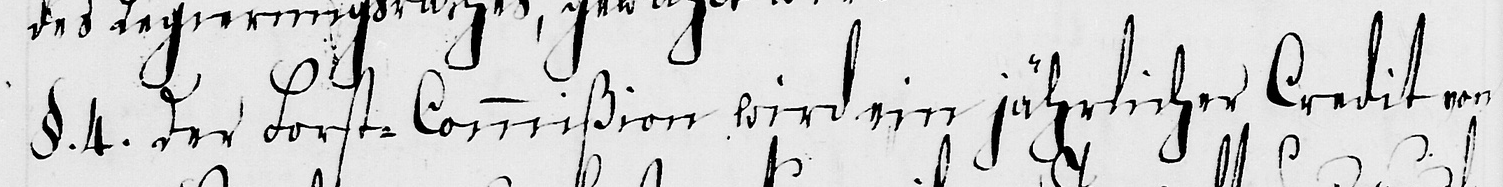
§. 4. Der Forst-Commißion wird ein jährlicher Credit von
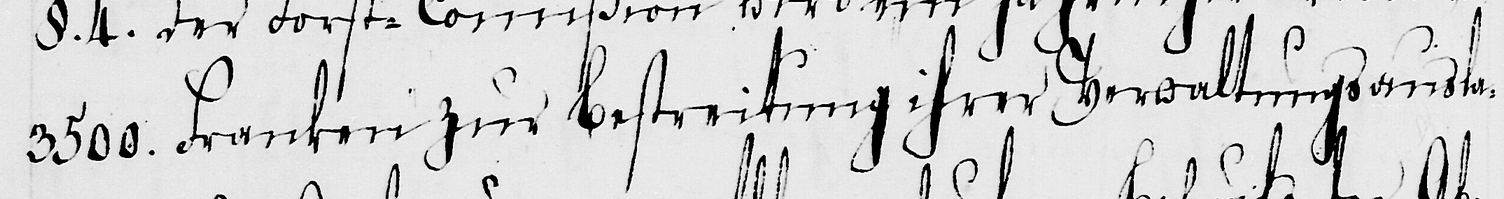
3500. Franken zur Bestreitung ihrer Verwaltungsausl¬
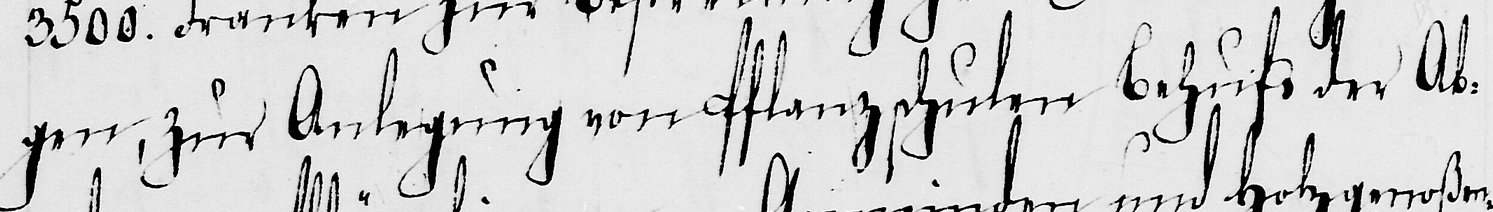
agen, zur Anlegung von Pflanzschulen Behufs der Ab¬
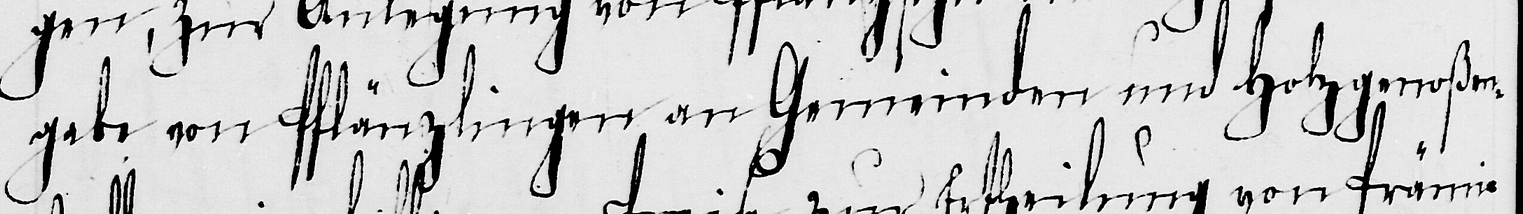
gabe von Pflänzlingen an Gemeinden und Holzgenoßen¬
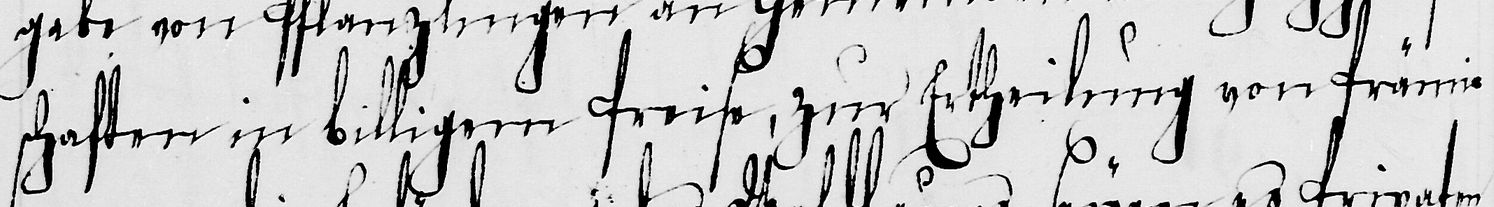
schaften in billigem Preise, zur Ertheilung von Prämi¬
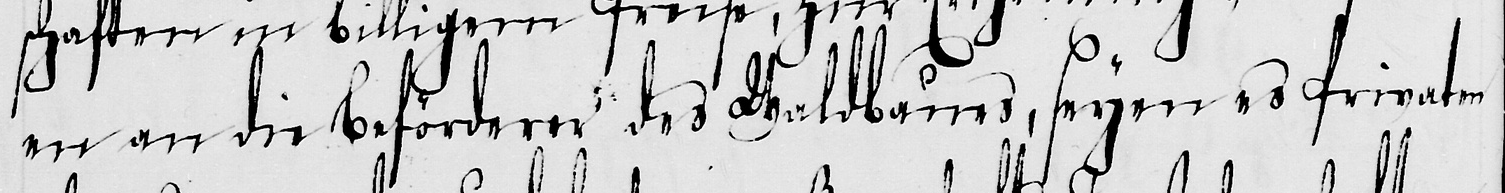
en an die Beförderer des Waldbaues, seyen es Private-
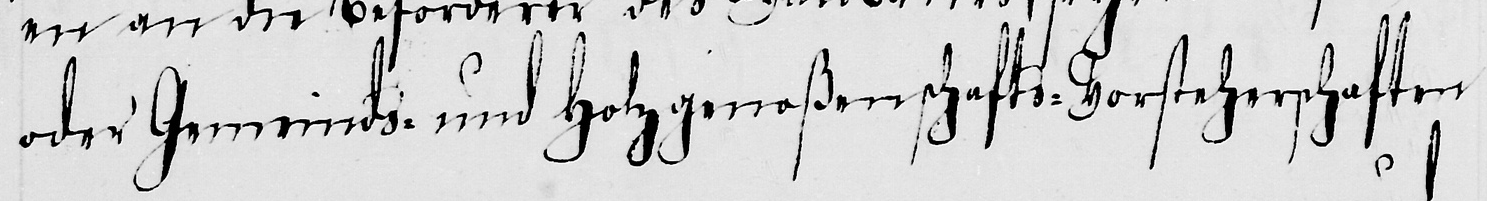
oder Gemeinds- und Holzgenoßenschafts-Vorsteherschaften
